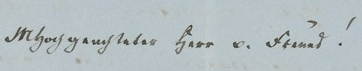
MHochgeachteter Herr u. Freund!
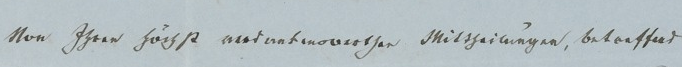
Von Ihren höchst verdankenswerthen Mittheilungen, betreffend
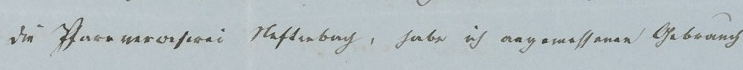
die Pfarrverweserei Neftenbach, habe ich angemessenen Gebrauch
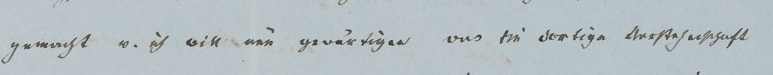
gemacht u. ich will nun gewärtigen was die dortige Vorsteherschaft
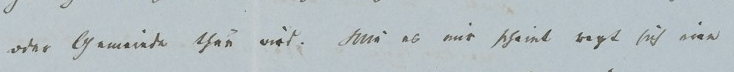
oder Gemeinde thun wird. Wie es mir scheint regt sich eine
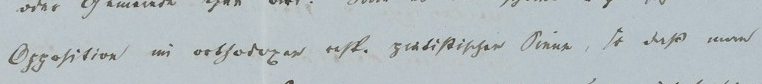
Opposition im orthodoxen resp. pietistischen Sinne, so daß man
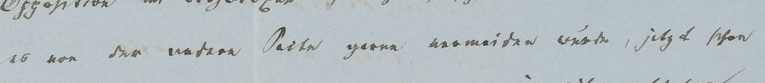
es von der andern Seite gerne vermeiden würde, jetzt schon
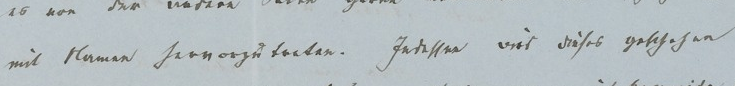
mit Namen hervorzutreten. Indessen wird dieses geschehen
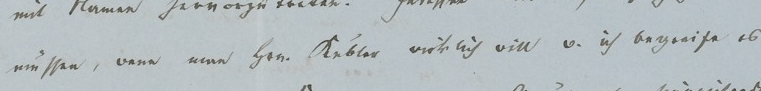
müssen, wenn man Hrn. Kübler wirklich will u. ich begreife es
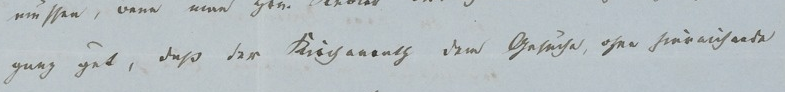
ganz gut, daß der Kirchenrath dem Gesuche, ohne hinreichende
